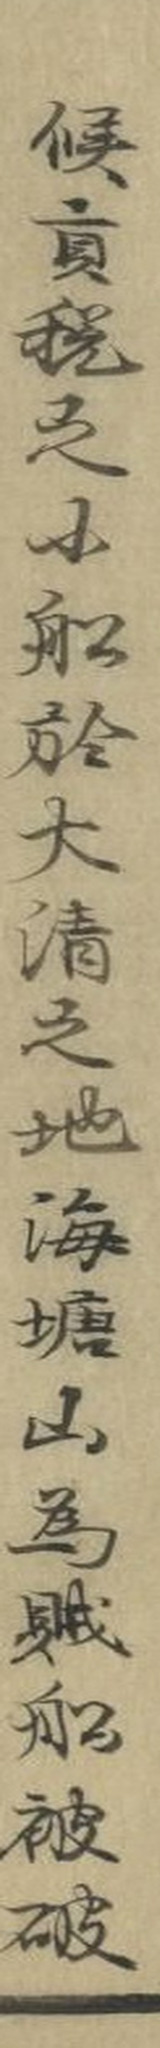候貢税之小舩於大清之地海塘山為賊舩被破
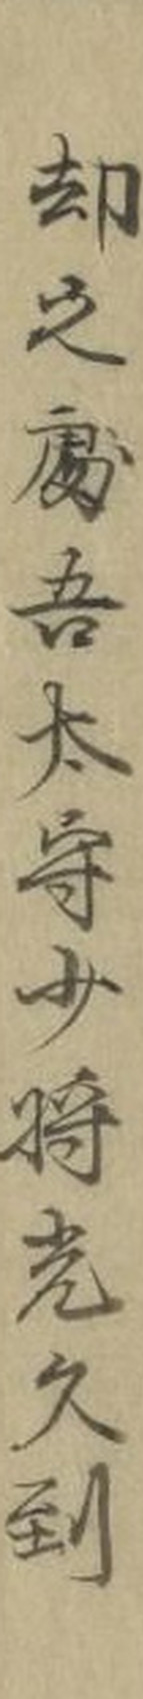却之處吾太守少将光久到
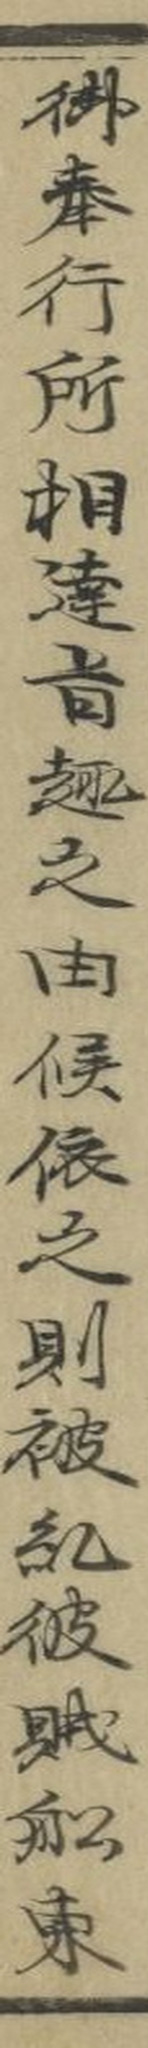御奉行所相達旨趣之由候依之則被糺彼賊舩東
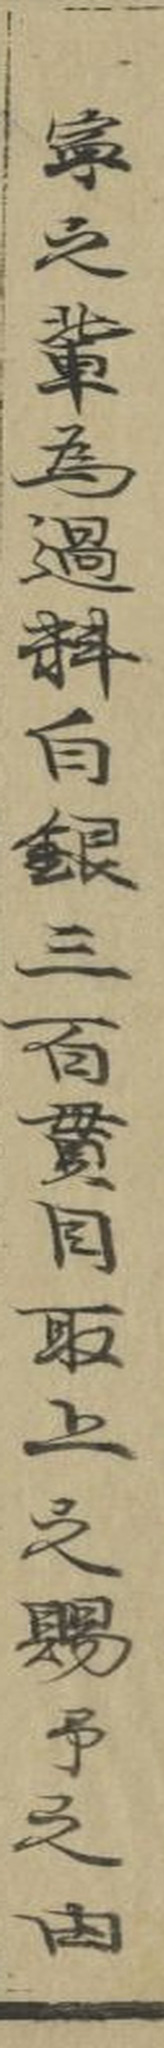寧之輩為過料白銀三百貫目取上之賜予之由
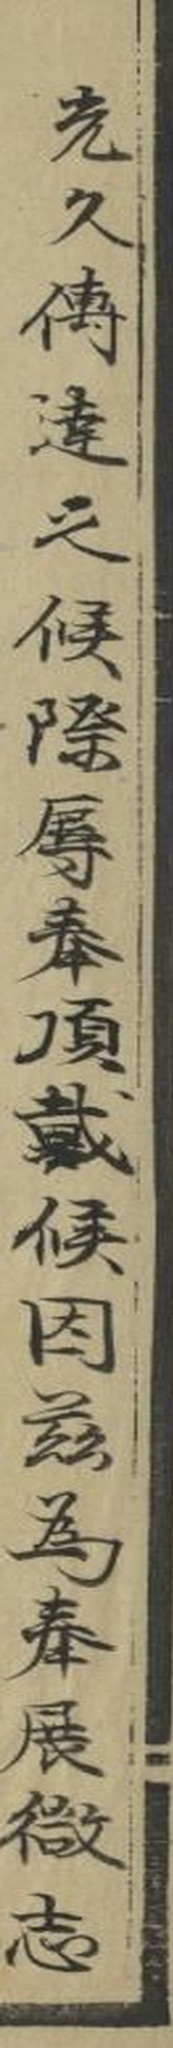光久伝達之候際辱奉頂戴候因茲為奉展徴志
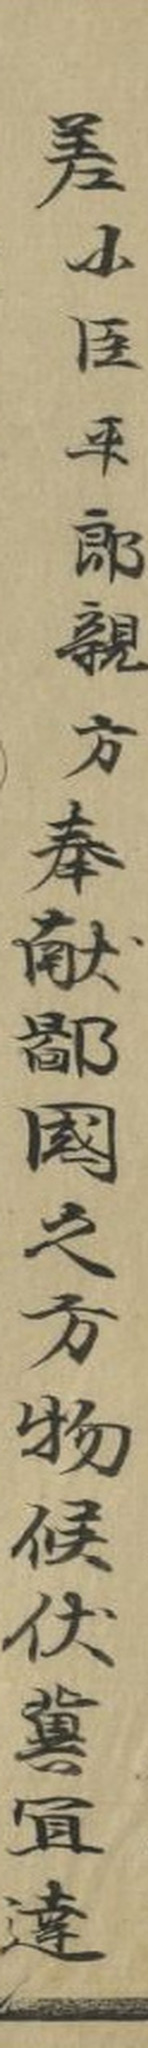差小臣平郎親方奉献鄙国之方物候伏冀宜達
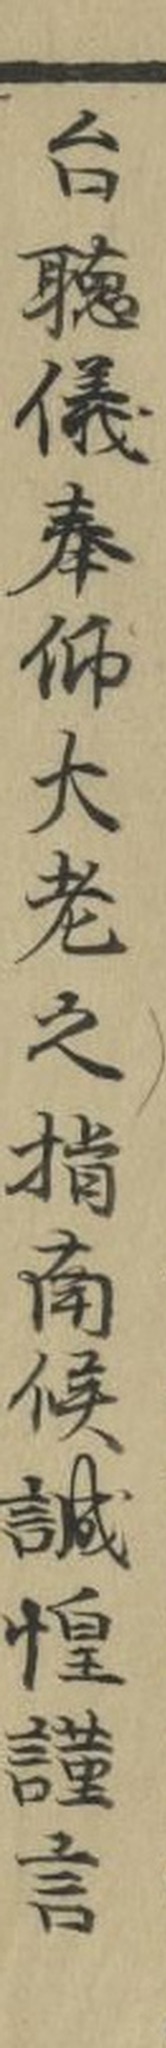台聴儀奉仰大老之指南候誠惶謹言
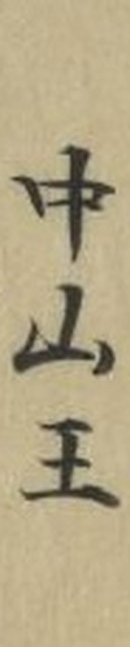中山王
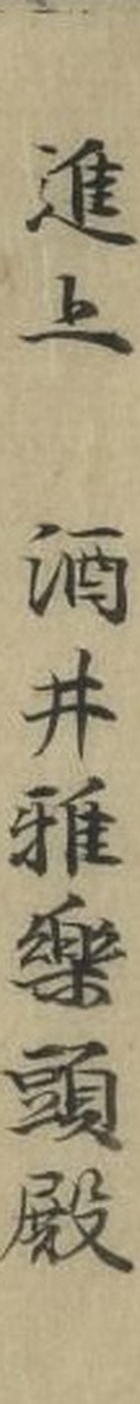進上酒井雅楽頭殿
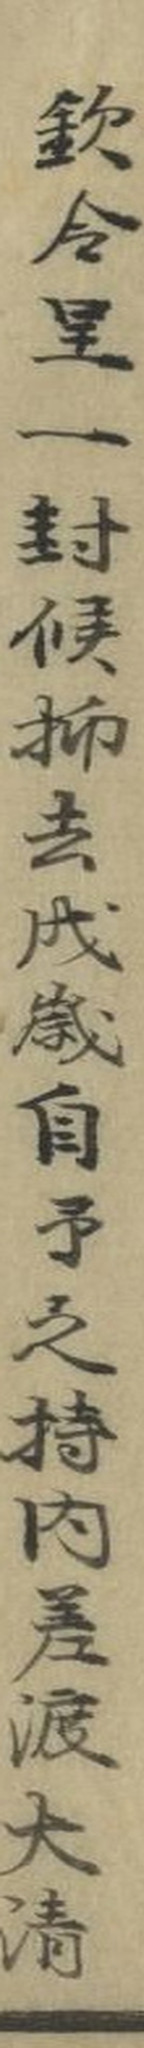欽令呈一封候抑去戌歳自予之持内差渡大清
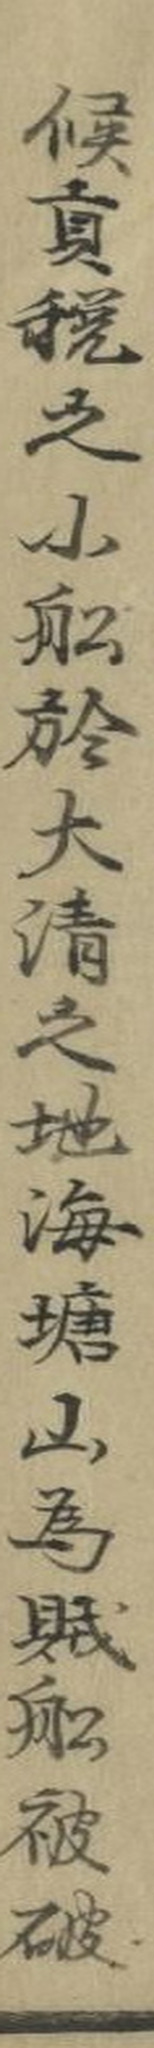候貢税之小舩於大清之地海塘山為賊舩被破

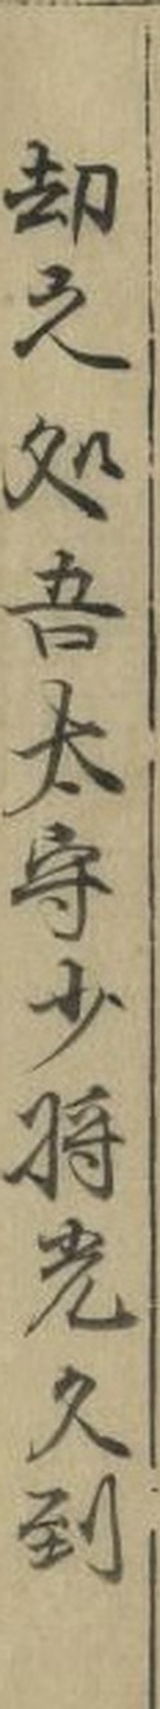却之処吾太守少将光久到
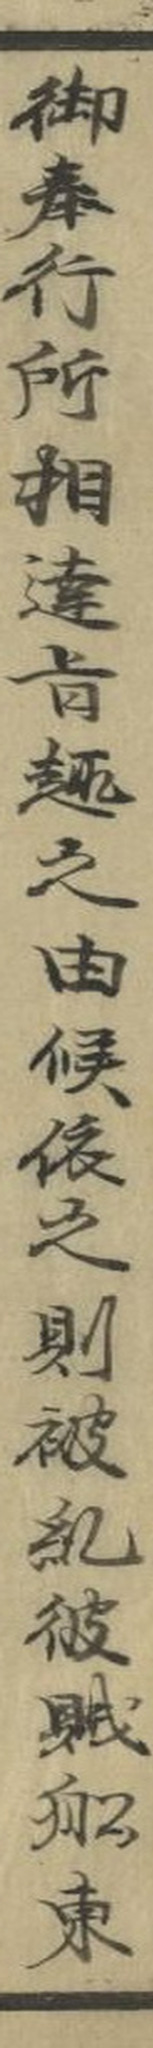御奉行所相達旨趣之由候依之則被糺彼賊舩東
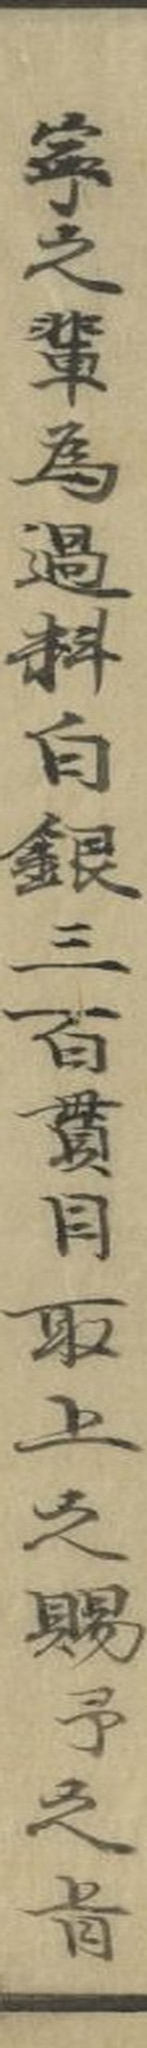寧之輩為過料白銀三百貫目取上之賜予之旨
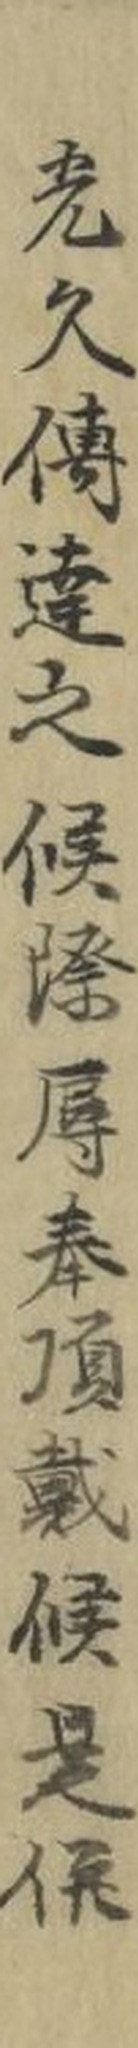光久伝達之候際辱奉頂戴候是併
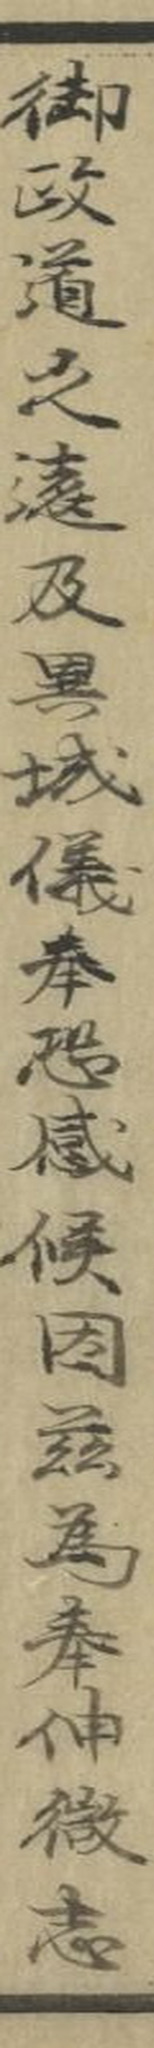御政道之遠及異域儀奉恐感候因茲為奉伸微志
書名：琉球往来（下）
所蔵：University of the Ryukyus Library
